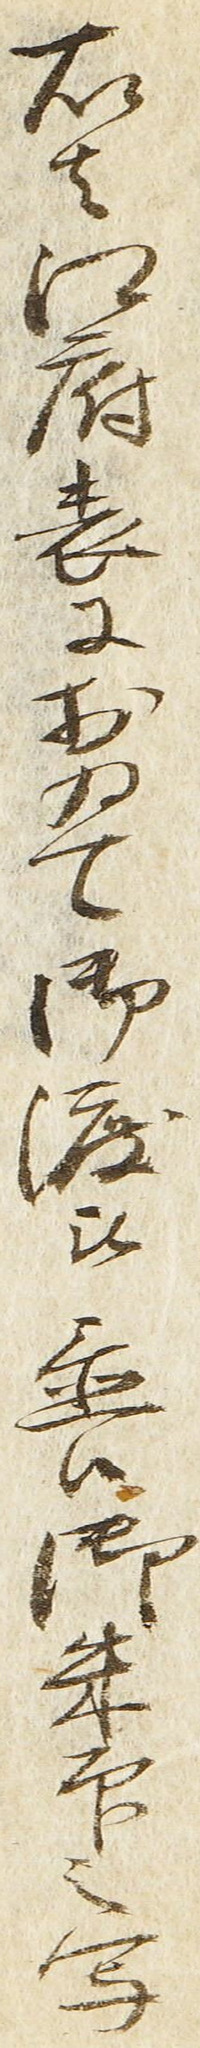右は江府表におゐて御渡被置候御朱印之写
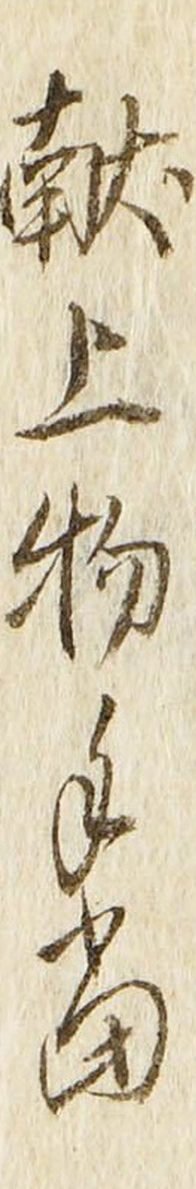献上物手当
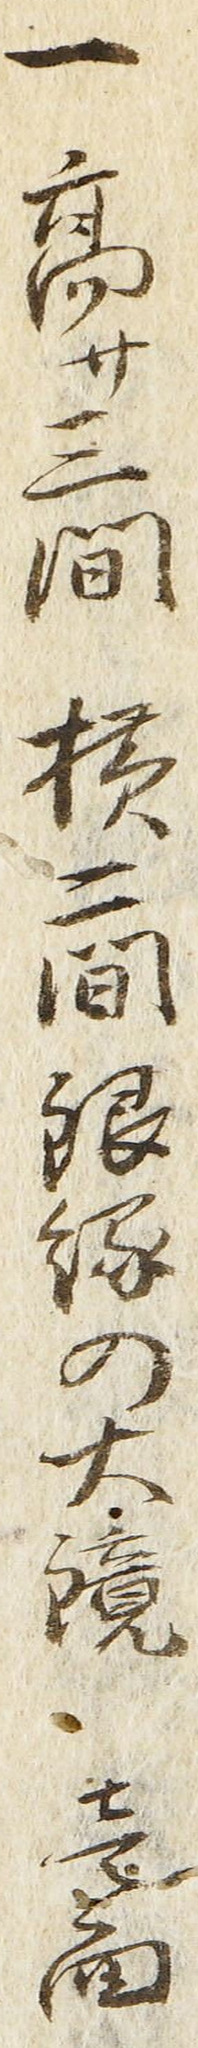一高サ三間横二間銀縁の大鏡壱面
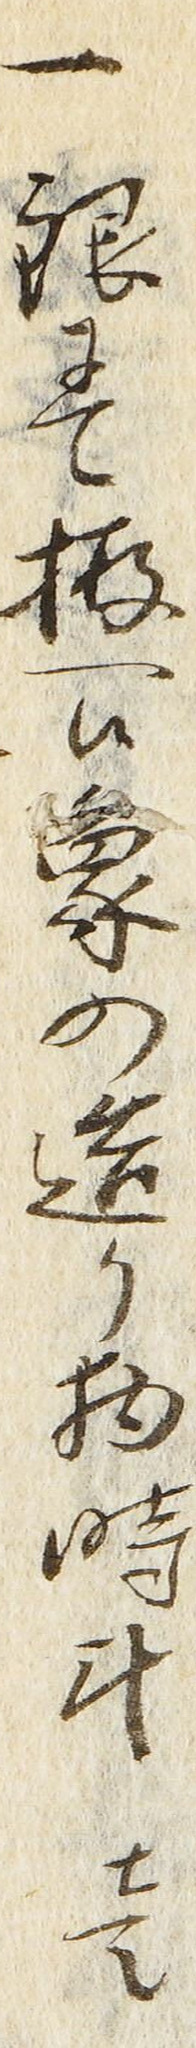一銀にて拵へ候象の造り物時計壱
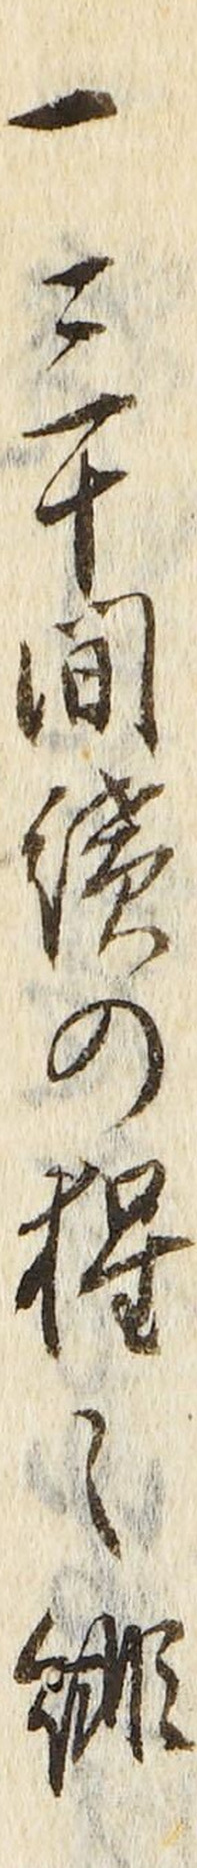一三十間続の猩々緋
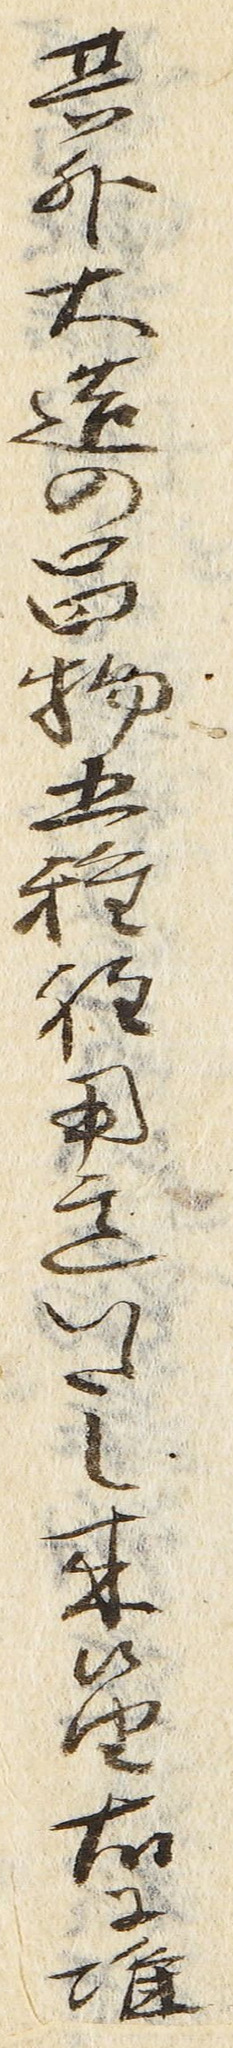其外大造の品物五種程用意いたし来候由右に准
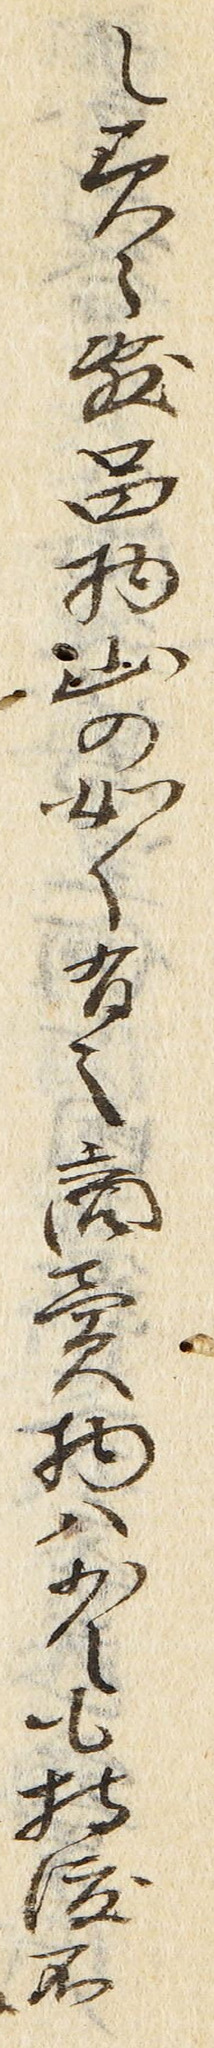し美々敷品物山の如く有之商売物は少しも持渡不申候
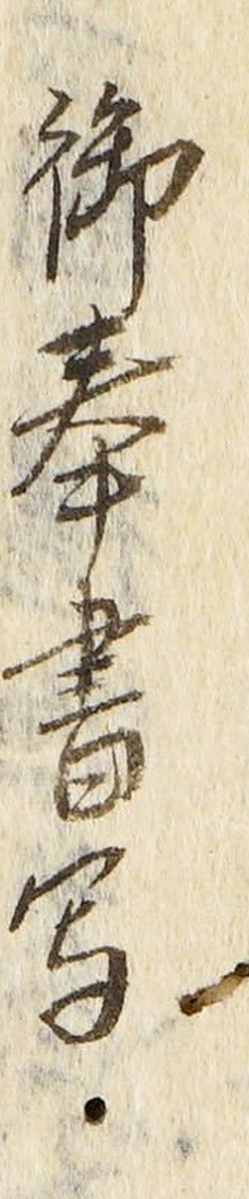御奉書写
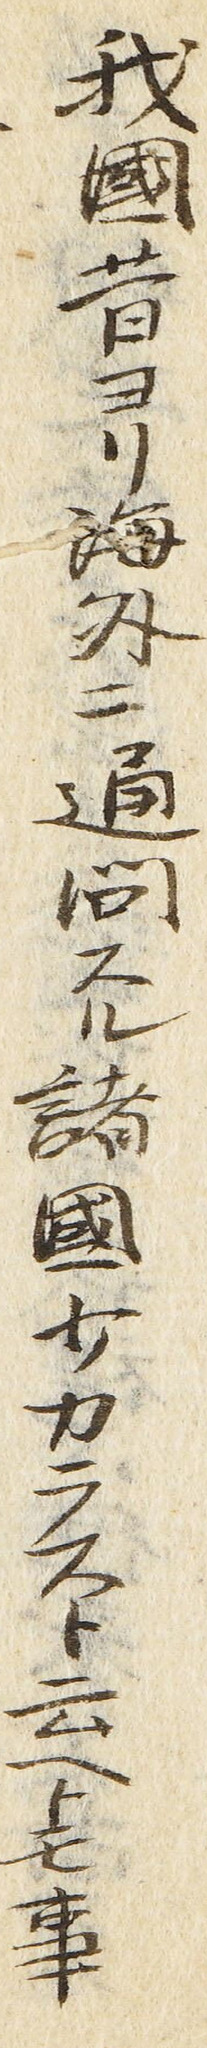我国昔ヨリ海外ニ通問スル諸国少カラスト云ヘトモ事
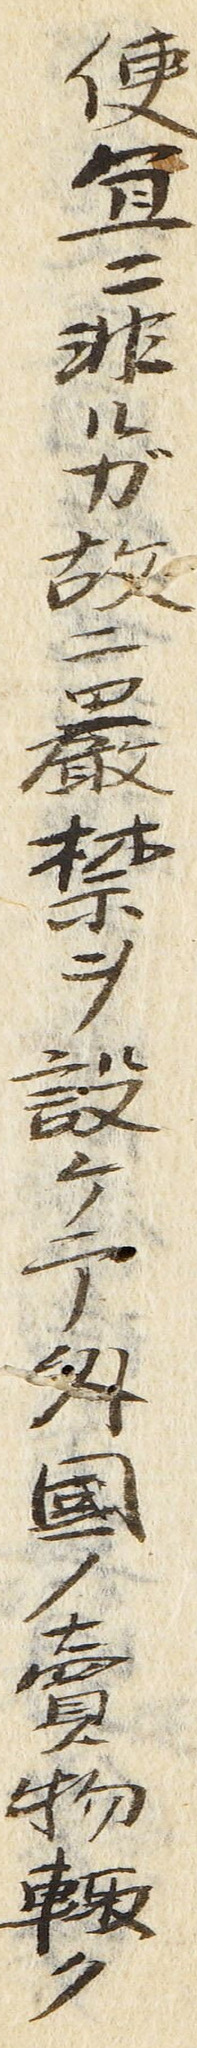便宜ニ非ルガ故ニ厳禁ヲ設ケテ外国ノ売物輙ク
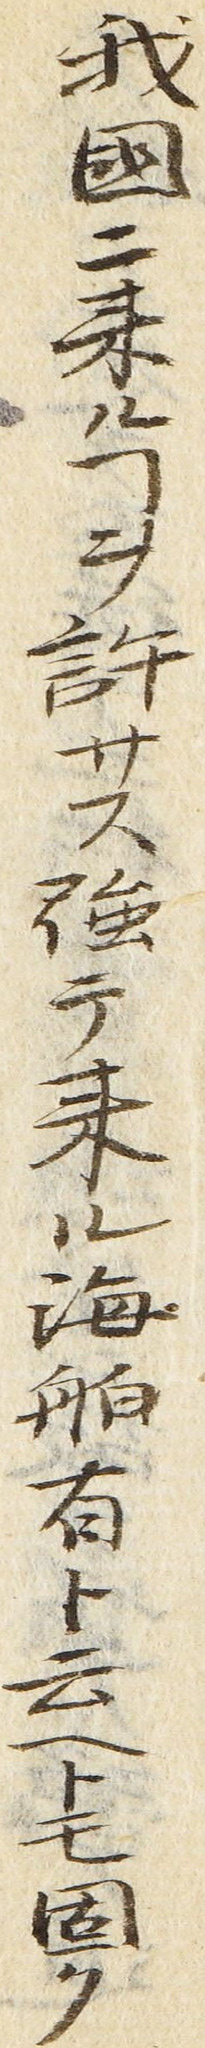我国ニ来ルヿヲ許サス強テ来ル海舶有ト云ヘトモ固ク
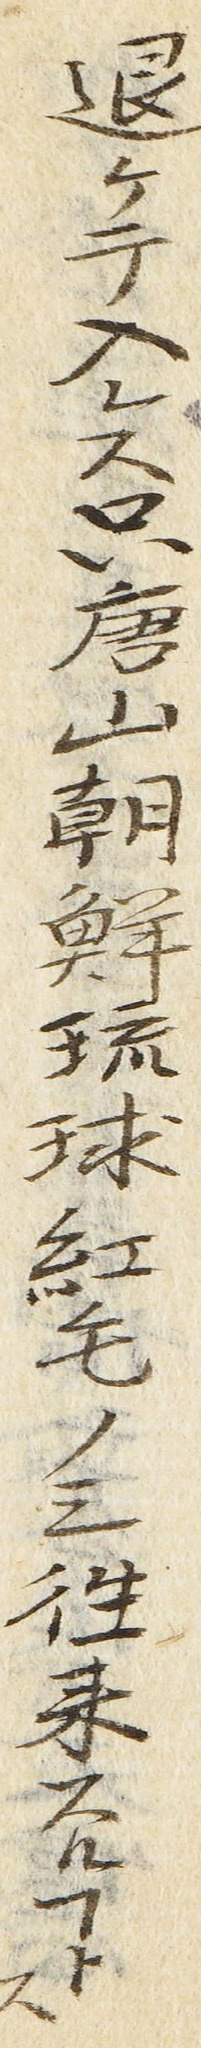退ケテ入レス只唐山朝鮮琉球紅毛ノミ往来スルヿトス
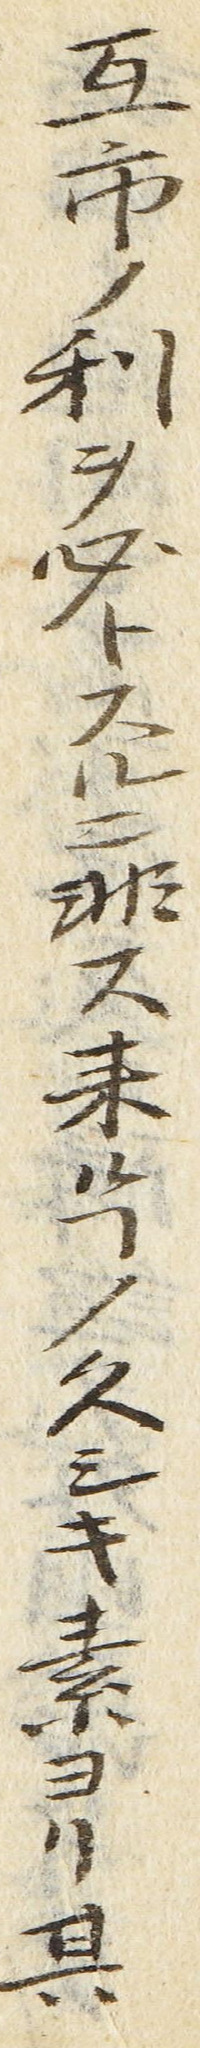互市ノ利ヲ必トスルニ非ス来ルヿノ久シキ素ヨリ其
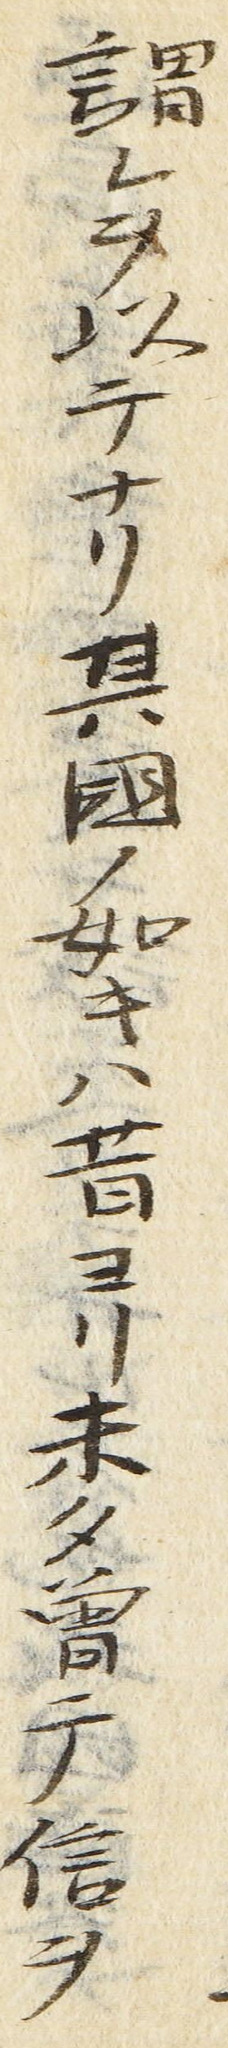謂レヲ以テナリ其国ノ如キハ昔ヨリ未タ曽テ信ヲ
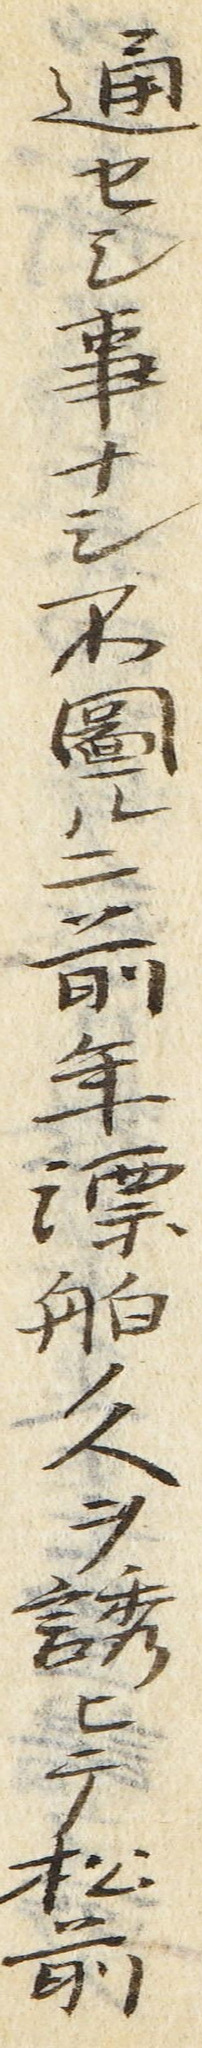通セシ事ナシ不図ルニ前年漂舶ノ人ヲ誘ヒテ松前
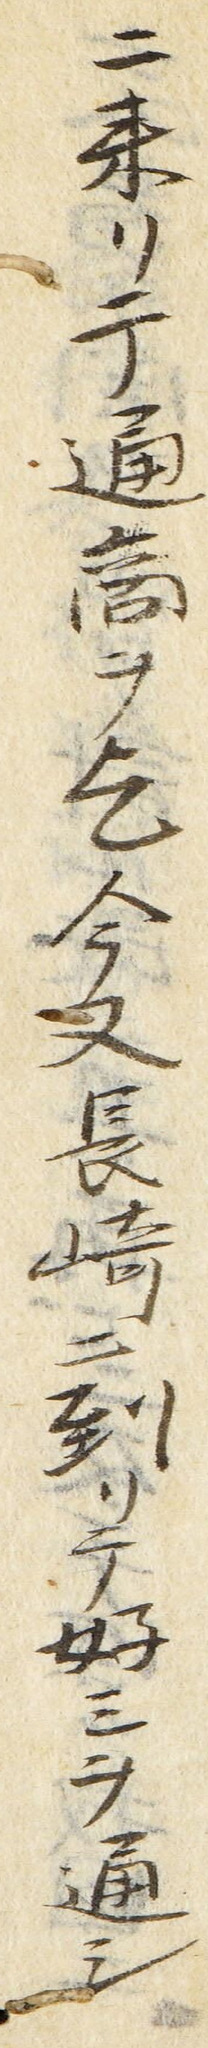ニ来リテ通商ヲ乞今又長崎ニ到リテ好ミヲ通シ
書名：漂民後記
